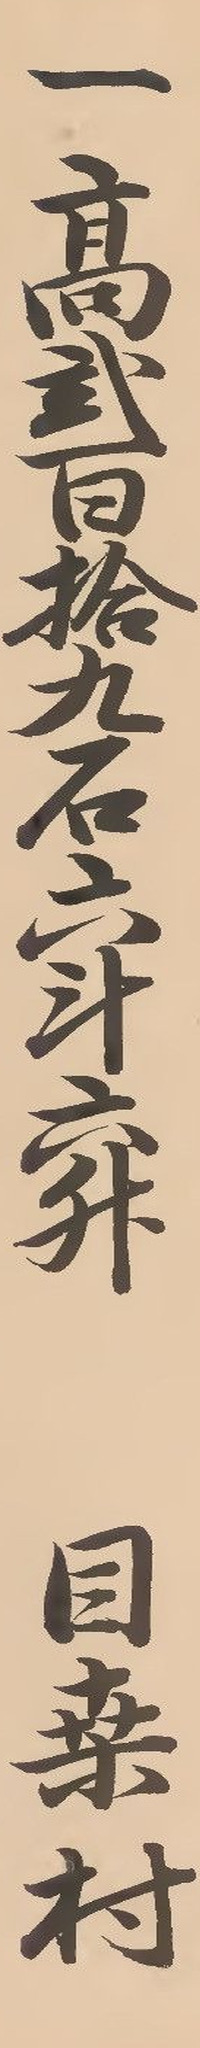一高弐百拾九石六斗六升目桑村
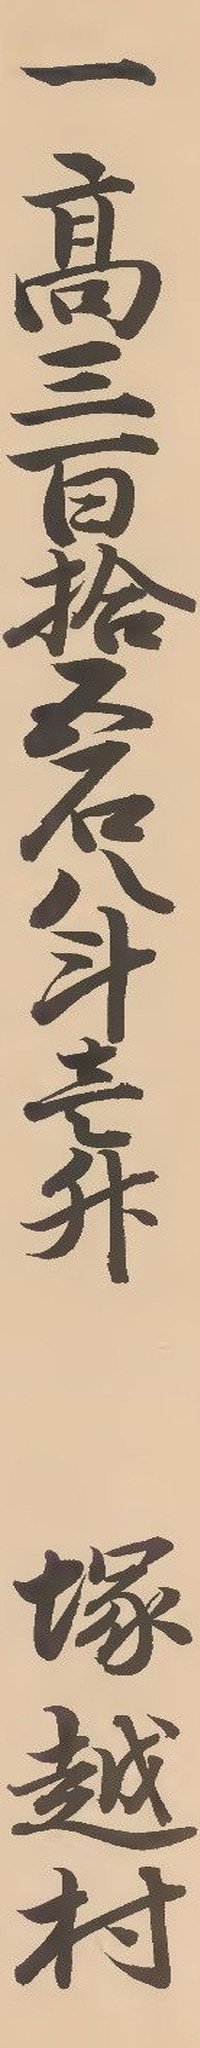一高三百拾五石八斗壱升塚越村
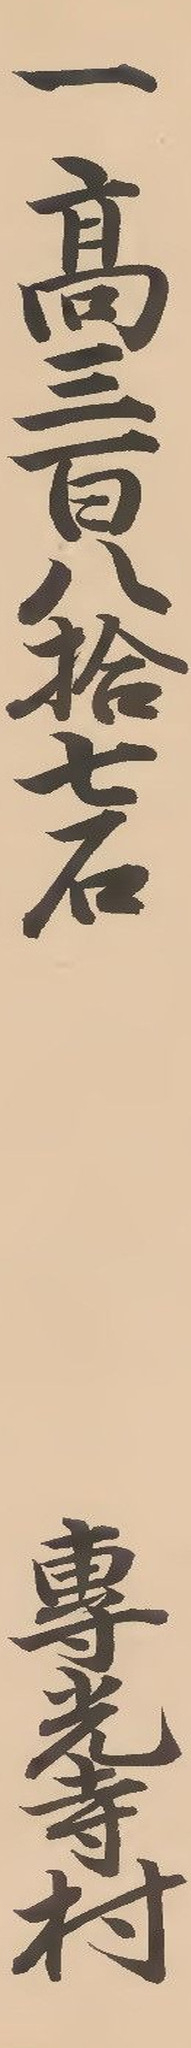一高三百八拾七石専光寺村
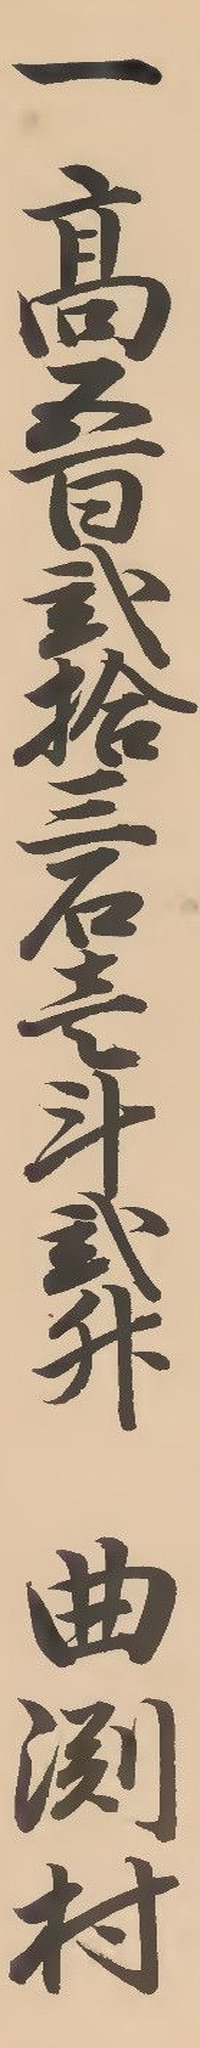一高五百弐拾三石壱斗弐升曲渕村

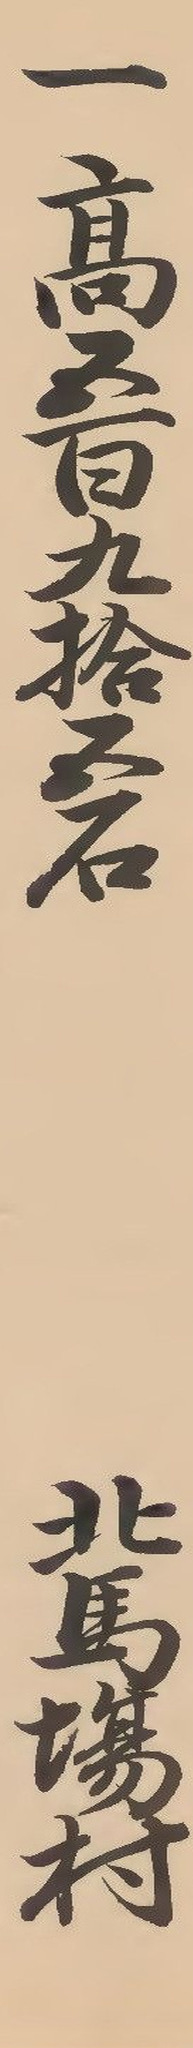一高五百九拾五石北馬場村
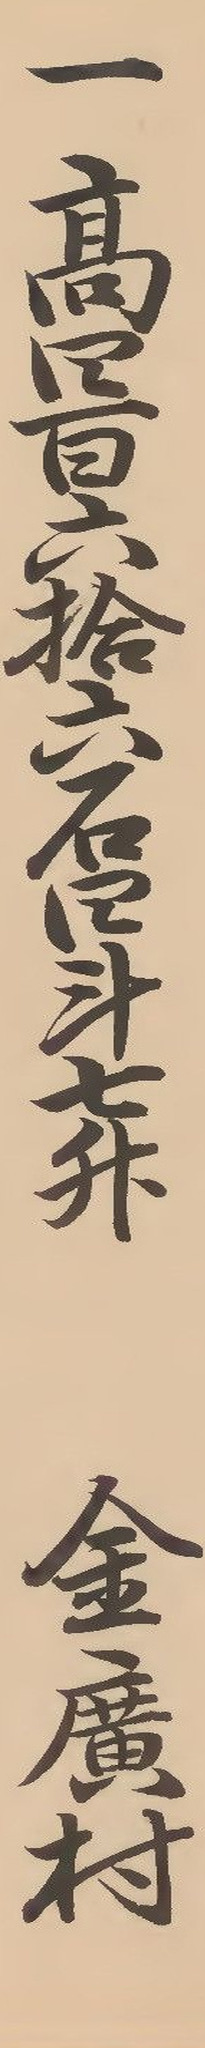一高四百六拾六石四斗七升金広村
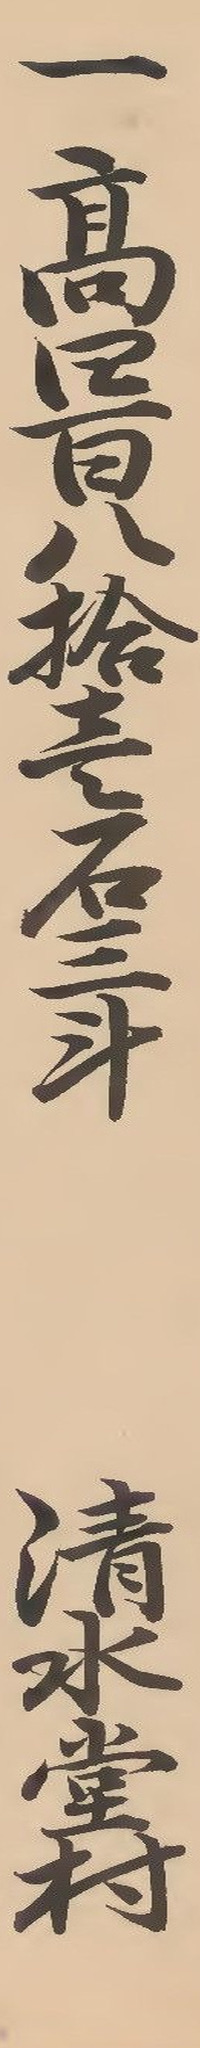一高四百八拾壱石三斗清水堂村
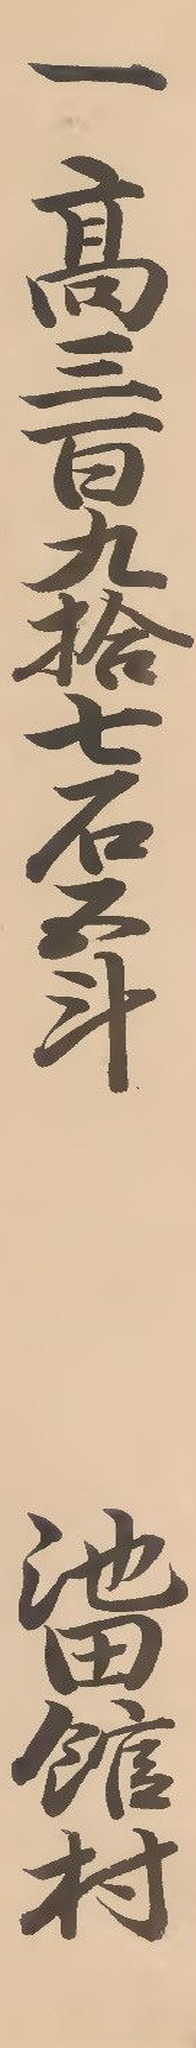一高三百九拾七石五斗池田館村
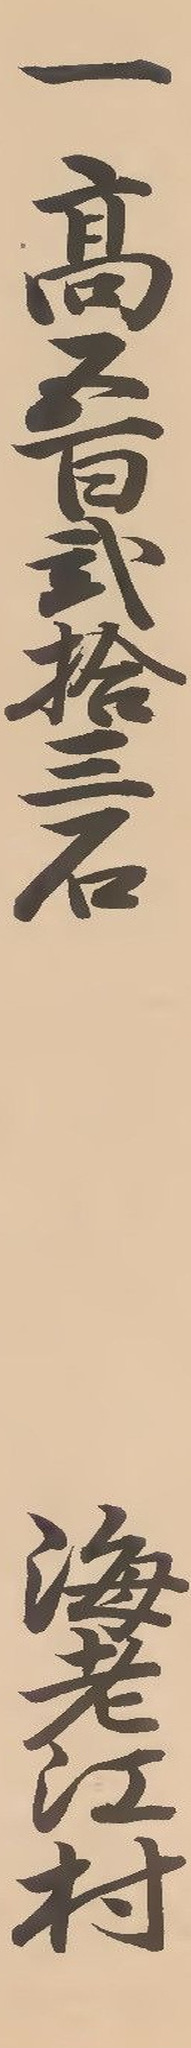一高五百弐拾三石海老江村
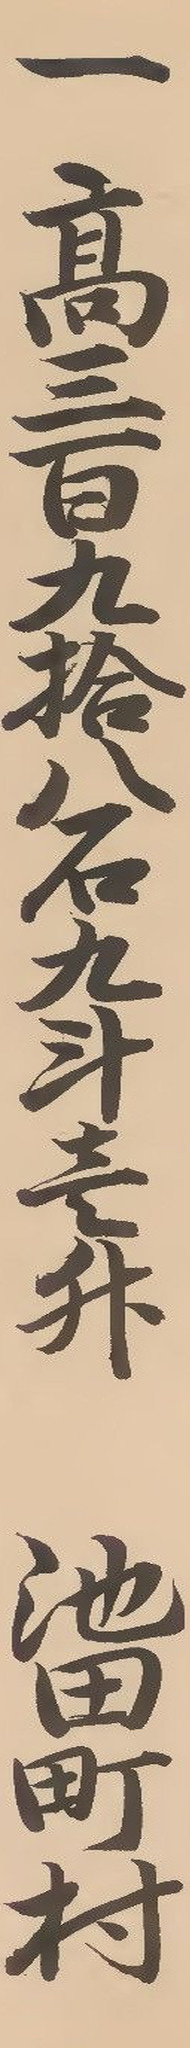一高三百九拾八石九斗壱升池田町村

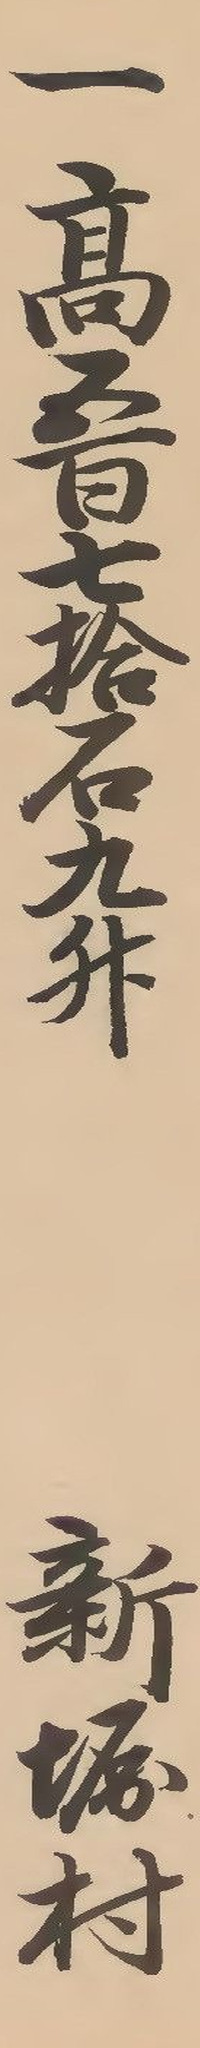一高五百七拾石九升新堀村
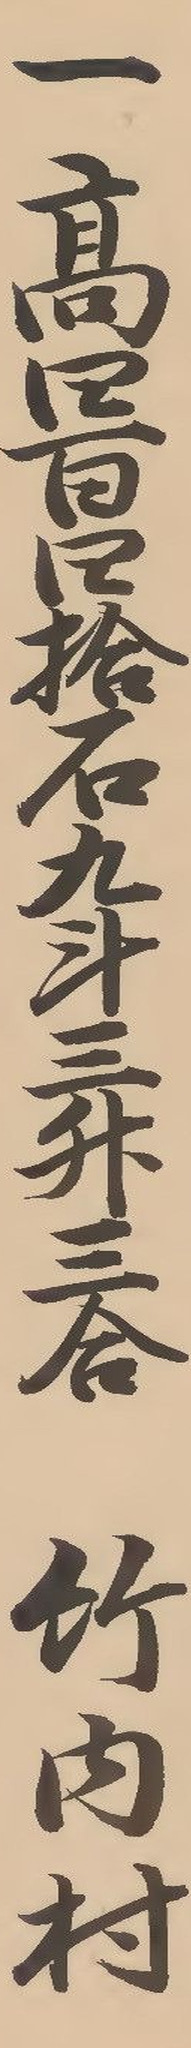一高四百四拾石九斗三升三合竹内村
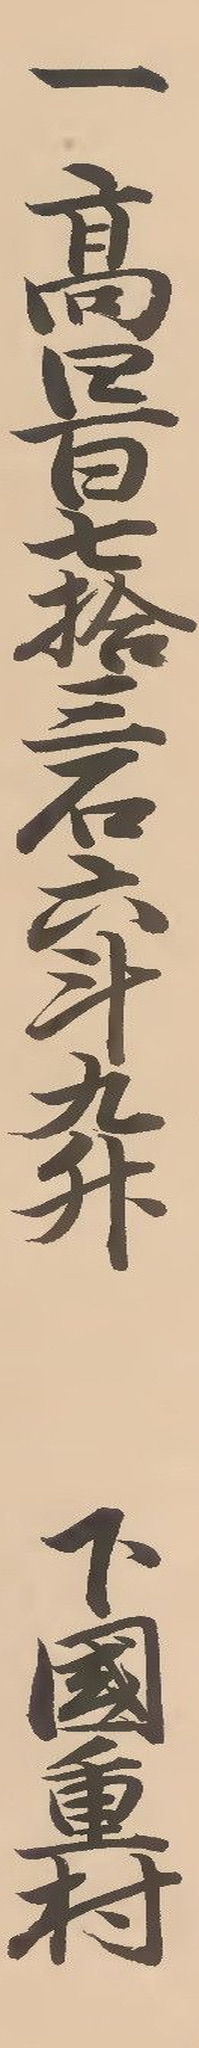一高四百七拾三石六斗九升下国重村
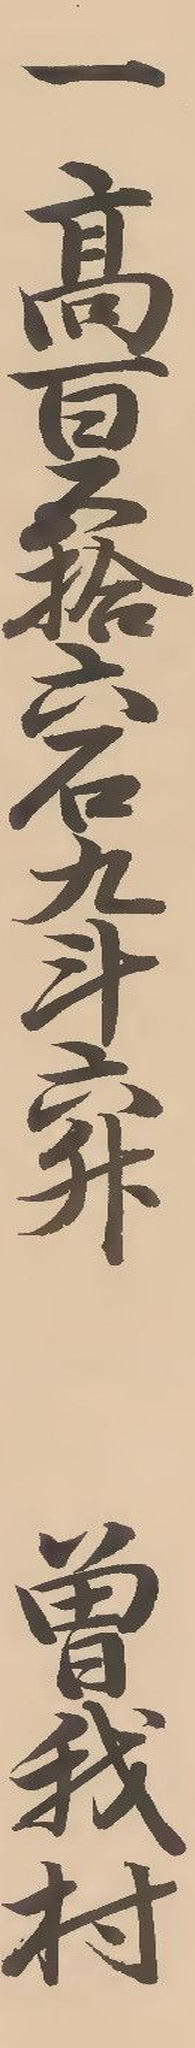一高百五拾六石九斗六升曽我村

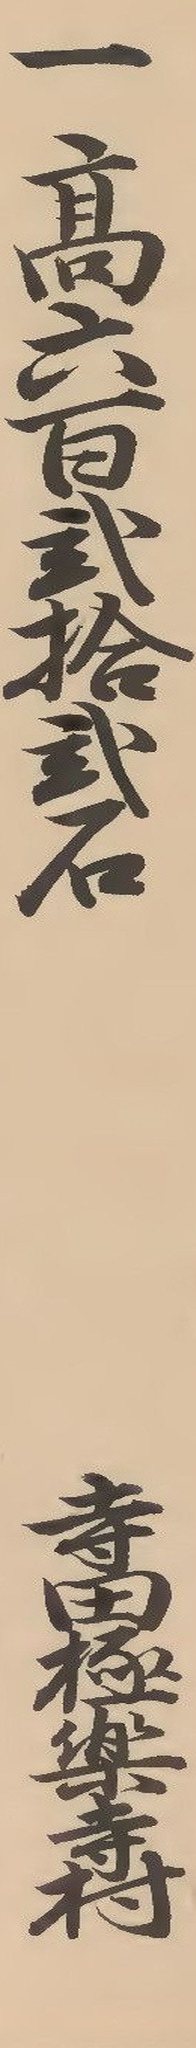一高六百弐拾弐石寺田極楽寺村
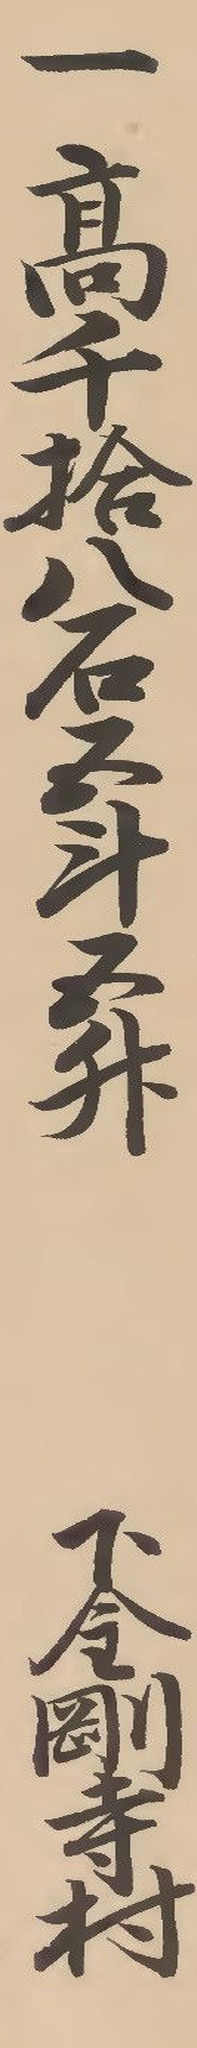一高千拾八石五斗五升下金剛寺村
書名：越中国郷帳
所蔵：国立公文書館 National Archives of Japan
